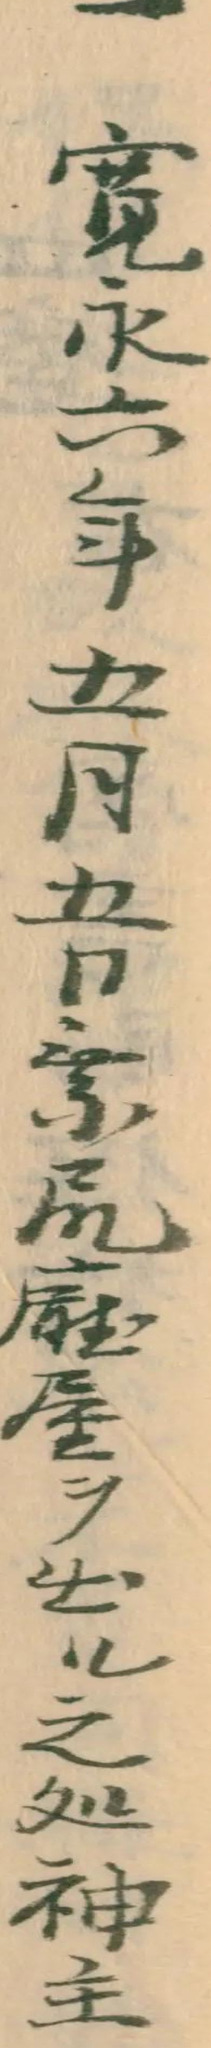一寛永六年五月五日乗尻庁屋ヲ出ル之処神主
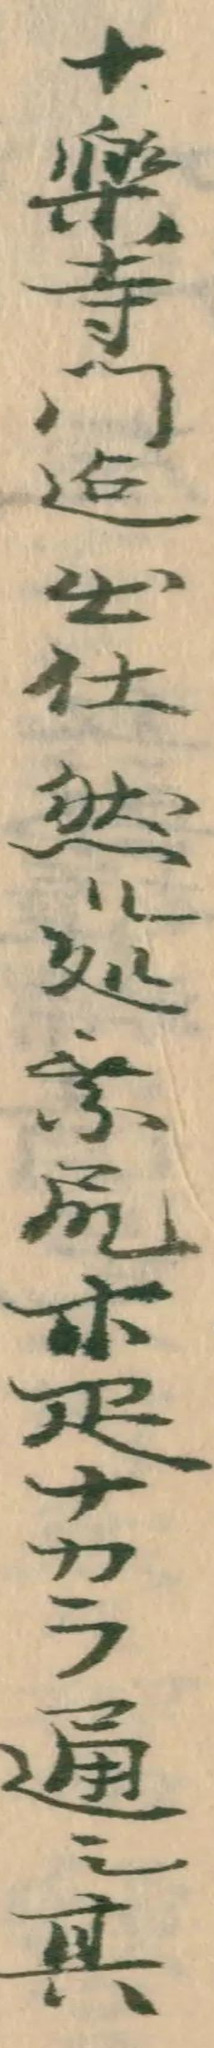十楽寺門迄出仕然ル処乗尻廿疋ナカラ通シ其
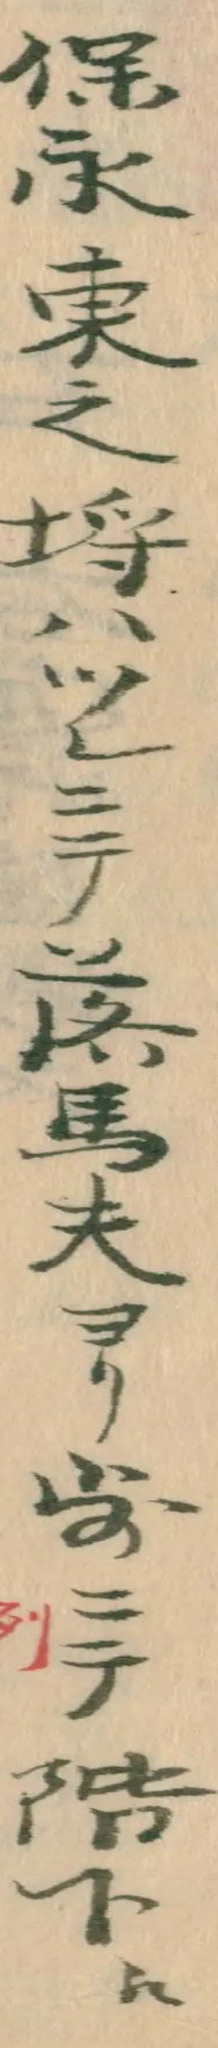保永東之埒ハツレニテ落馬夫ヨリ歩ニテ階下江
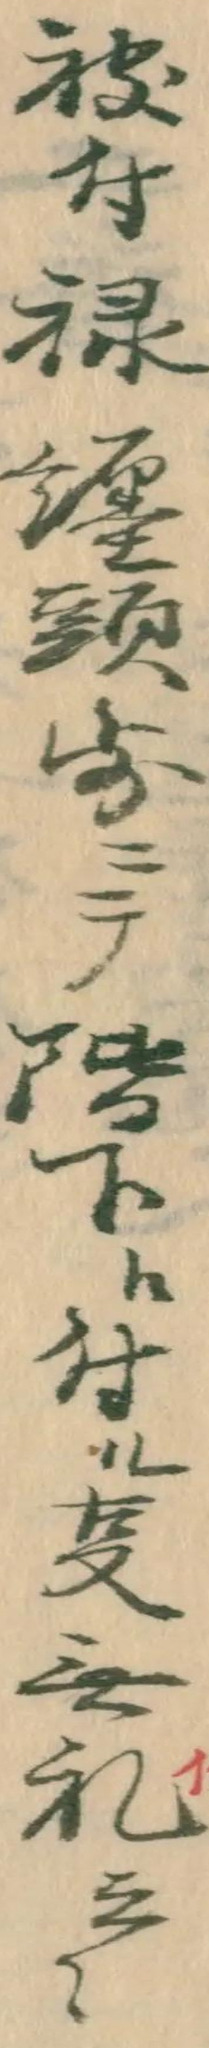被付禄纏頭歩ニテ階下江付ル事無礼云々
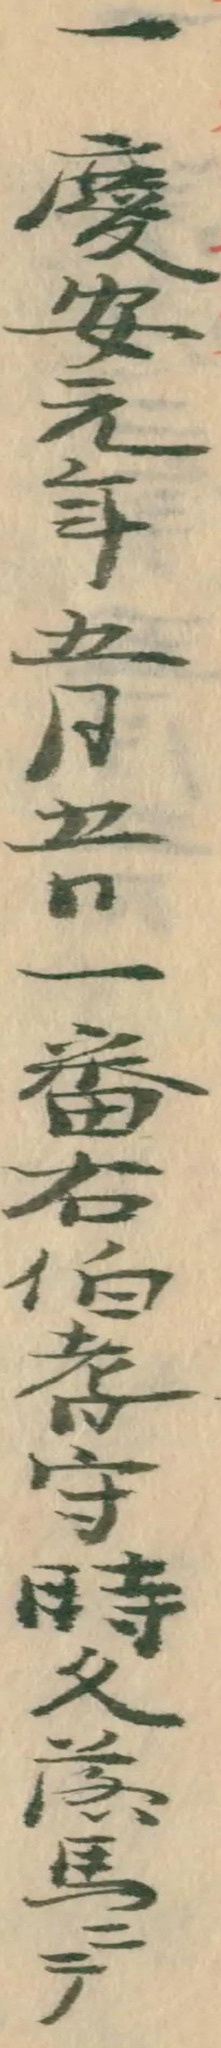一慶安元年五月五日一番右伯耆守時久落馬ニテ
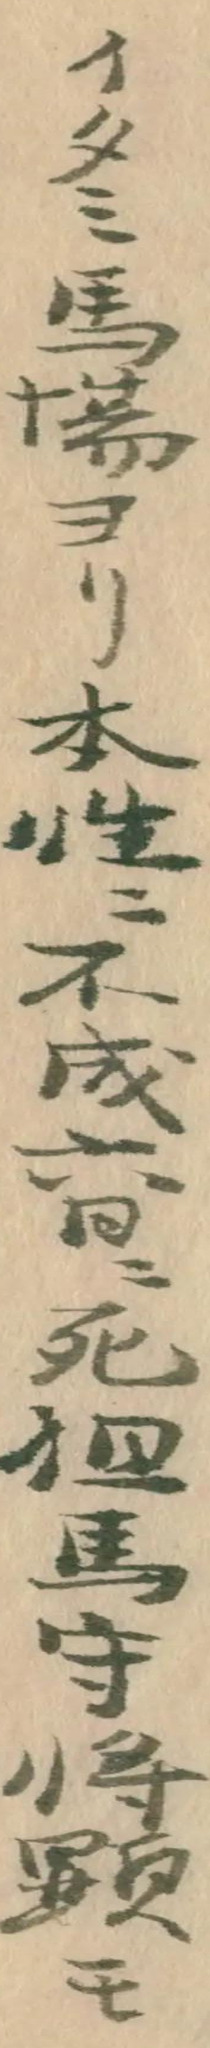イタミ馬場ヨリ本性ニ不成六日ニ死但馬守将顕モ
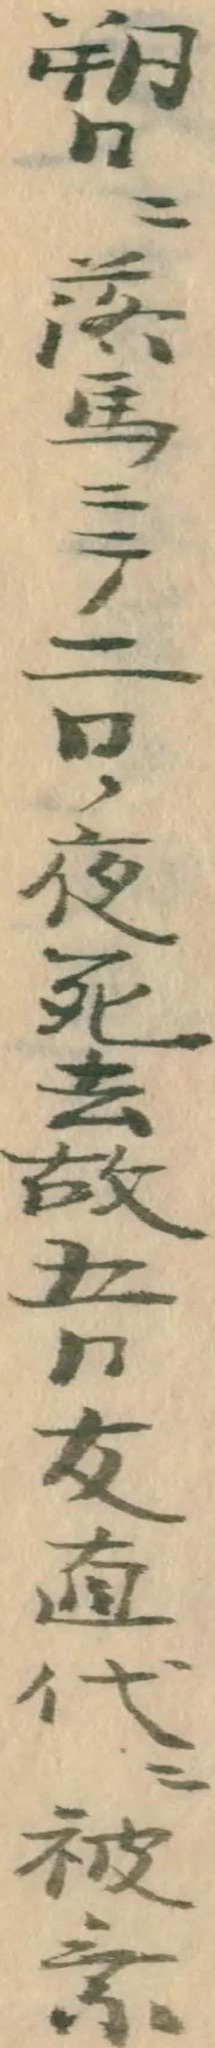朔日ニ落馬ニテ二日ノ夜死去故五日友直代ニ被乗

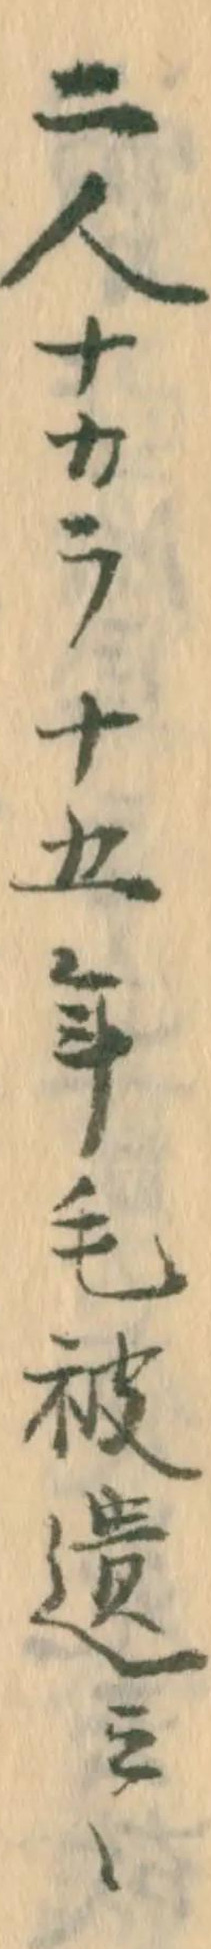二人ナカラ十五年毛被遺云々
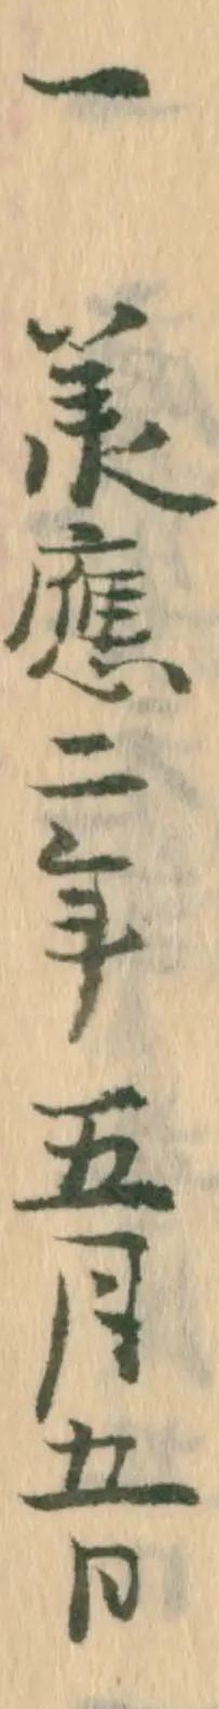一承応二年五月五日
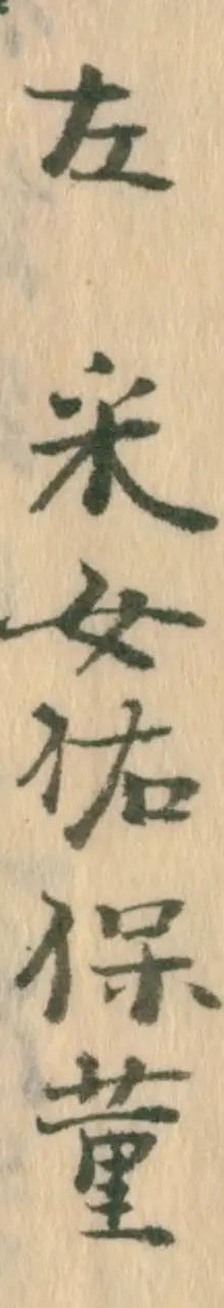左采女佑保菫
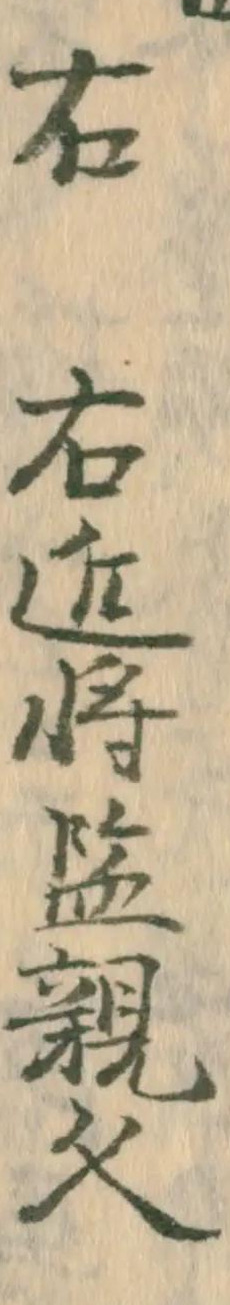右右近将監親久
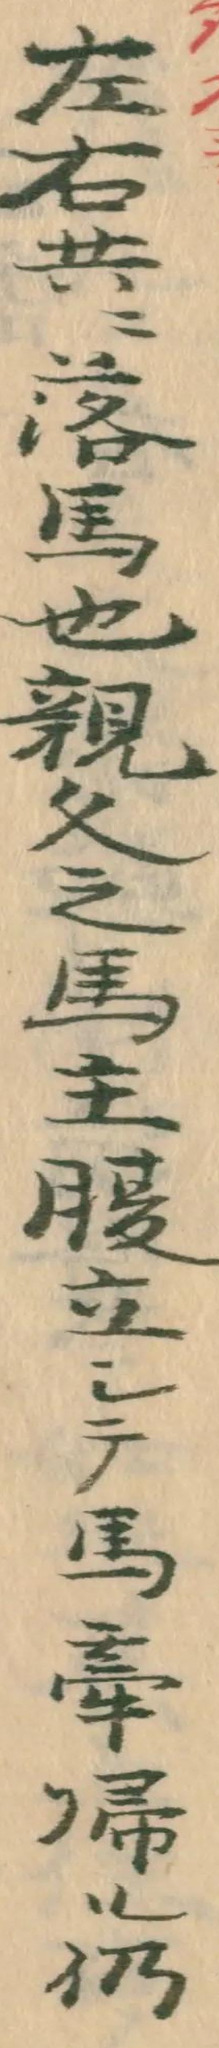左右共ニ落馬也親久之馬主腹立シテ馬牽帰ル仍
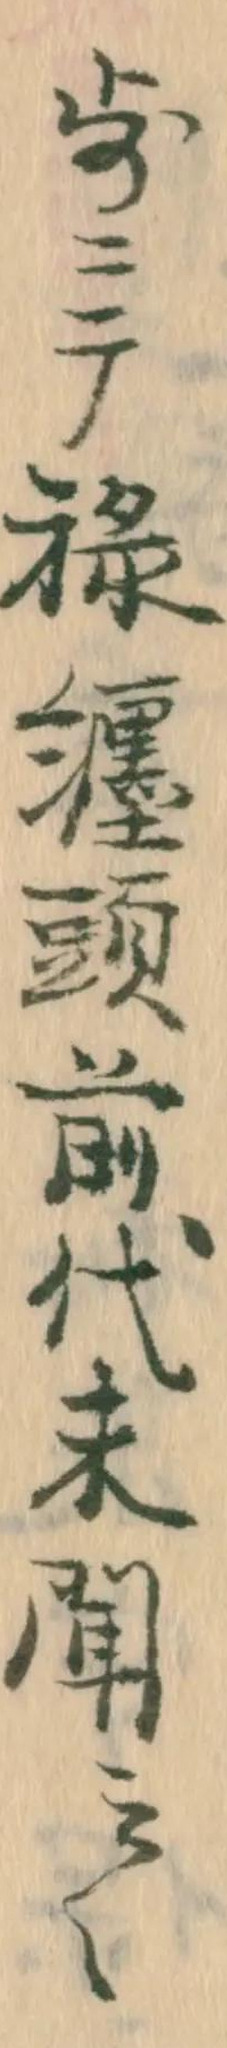歩ニテ禄纏頭事前代未聞云々
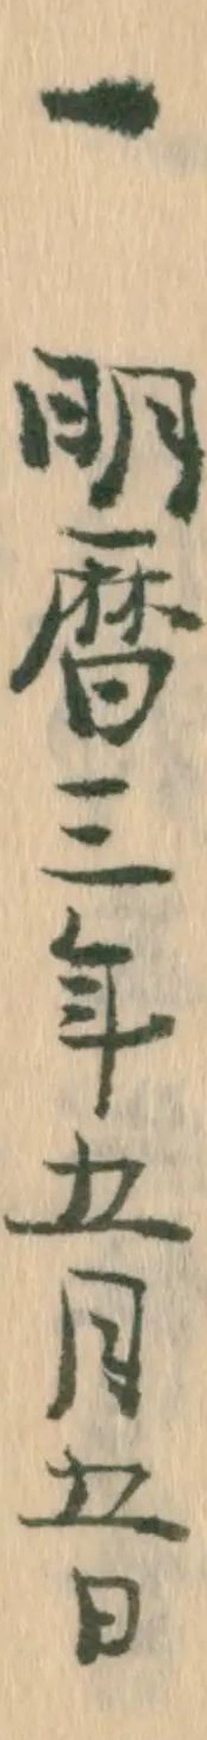一天和三年五月五日
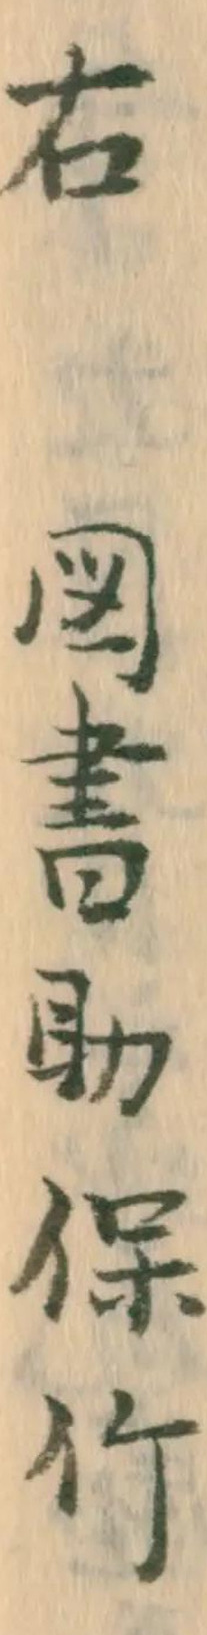右図書助保竹
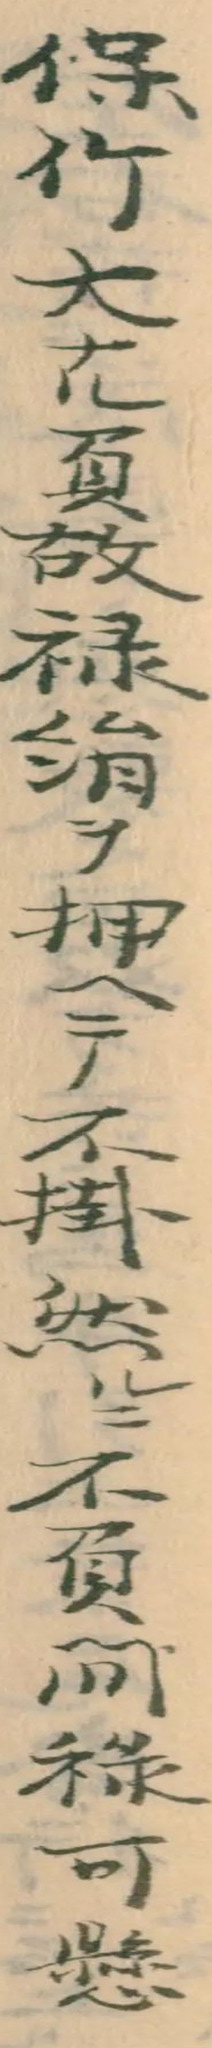保竹大ナル負故禄絹ヲ押へテ不掛然ルニ不負間禄可懸
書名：賀茂社記録. 第12冊
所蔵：国立国会図書館 National Diet Library, JAPAN
